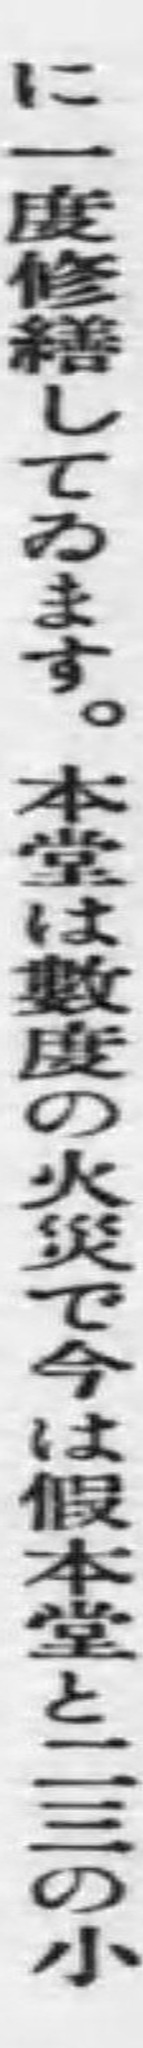に一度修繕してゐます。本堂は數度の火災で今は假本堂と二三の小
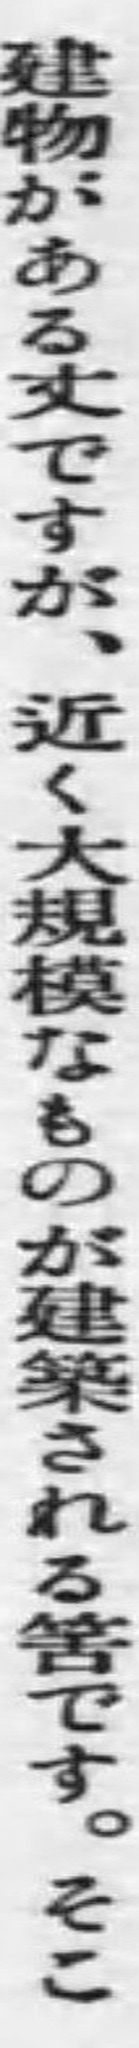建物がある丈ですが、近く大規模なものが建築される筈です。そこ
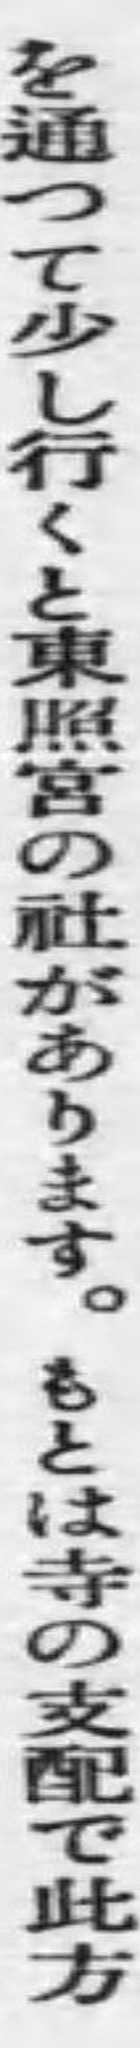を通つて少し行くと東照宮の社があります。もとは寺の支配で此方
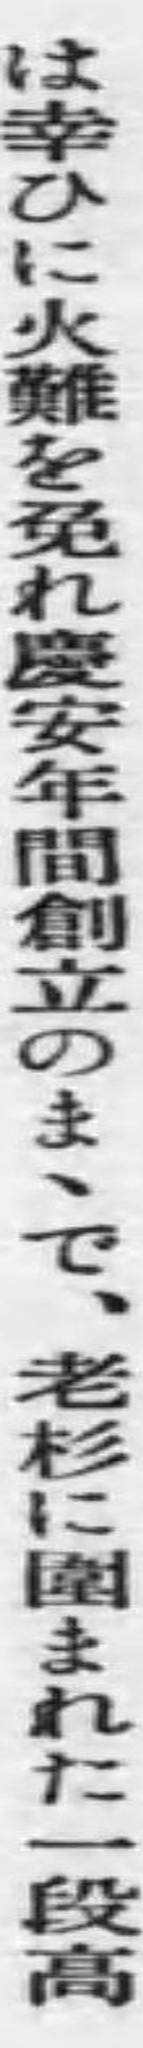は幸ひに火難を免れ慶安年間創立のまヽで、老杉に圍まれた一段高
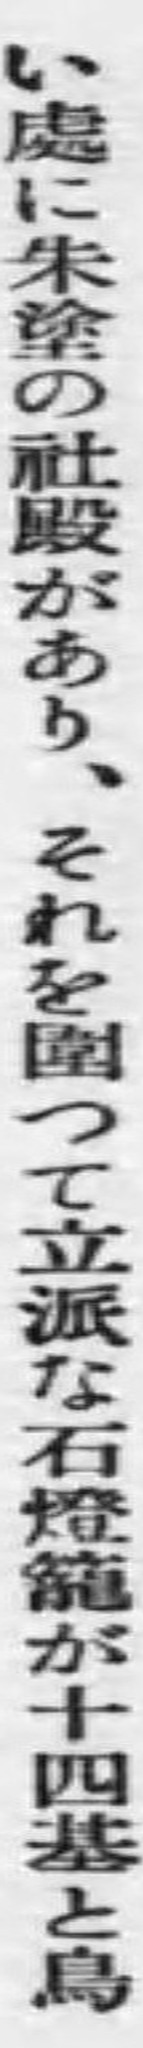い處に朱塗の社殿があり、それを圍つて立派な石燈籠が十四基と鳥
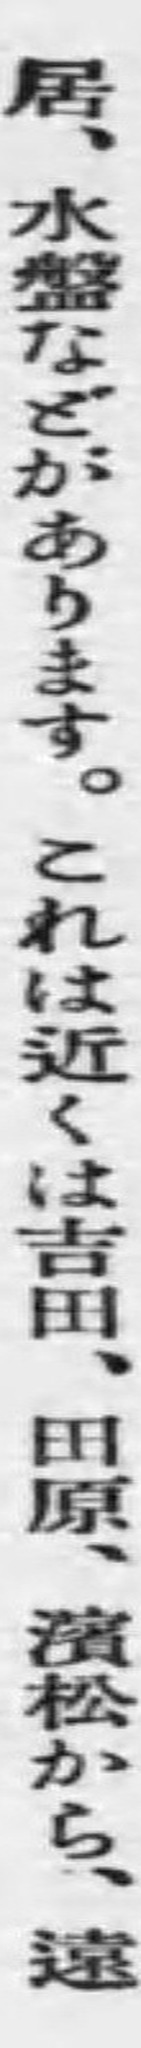居、水盤などがあります。これは近くは吉田、田原、濱松から、遠
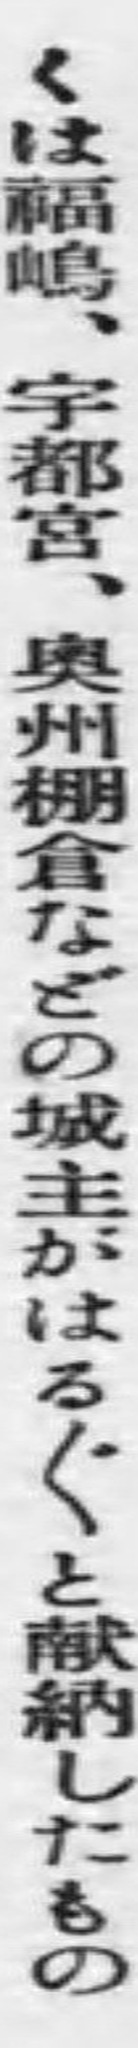くは福嶋、宇都宮、奥州棚倉などの城主がはる〴〵と献納したもの
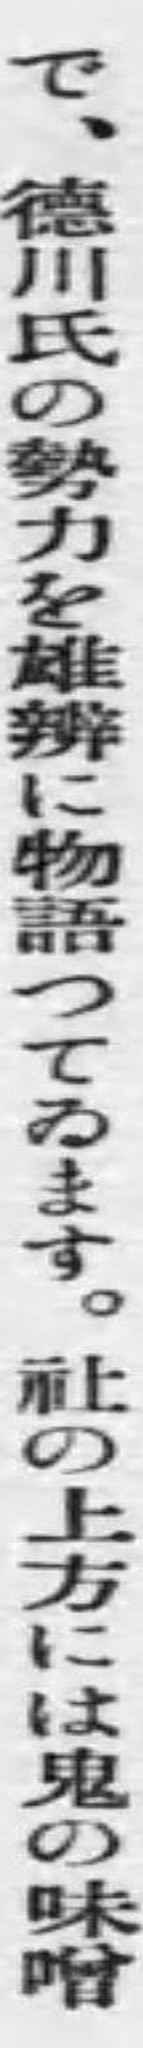で、徳川氏の勢力を雄辨に物語つてゐます。社の上方には鬼の味噌
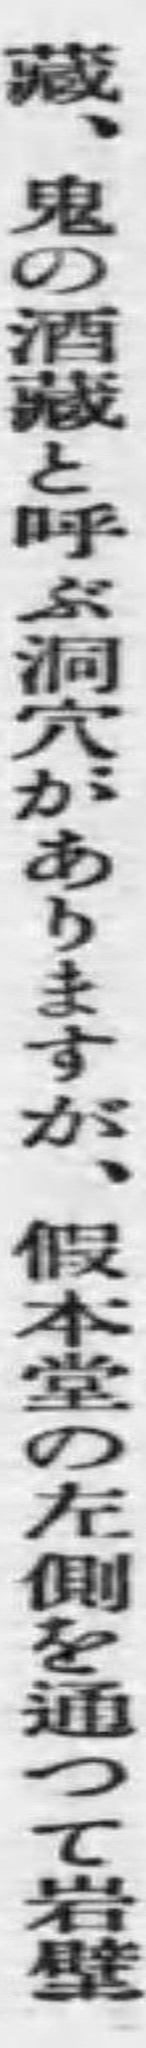蔵、鬼の酒蔵と呼ぶ洞穴がありますが、假本堂の左側を通つて岩壁
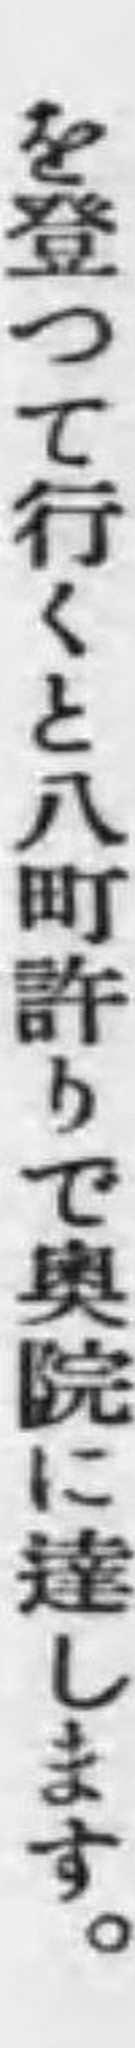を登つて行くと八町許りで奥院に達します。
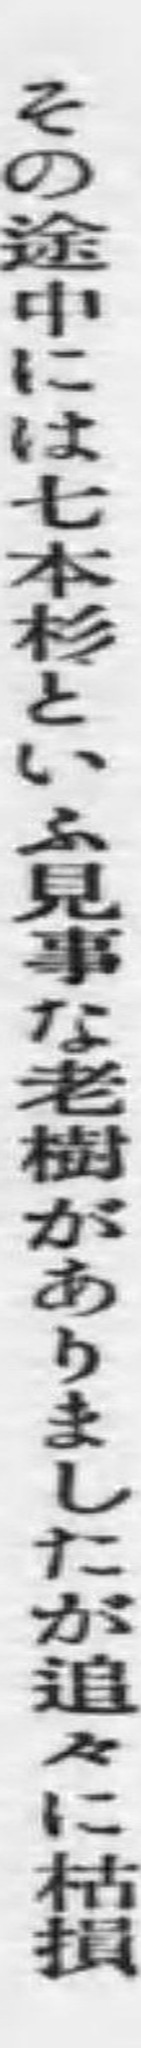その途中には七本杉といふ見事な老樹がありましたが追々に枯損
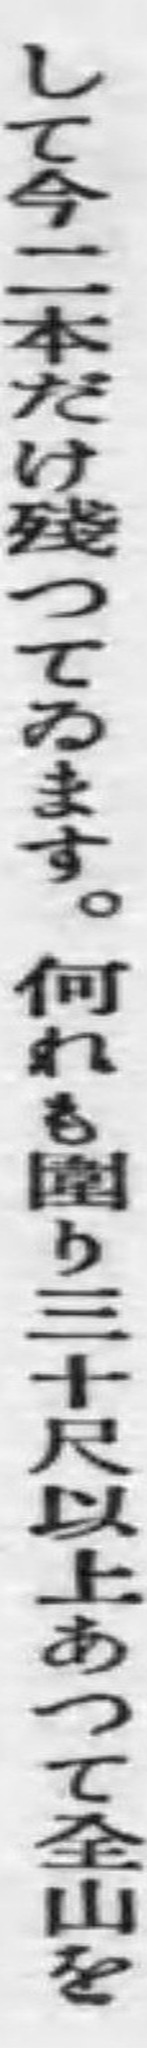して今二本だけ殘つてゐます。何れも圍り三十尺以上あつて全山を
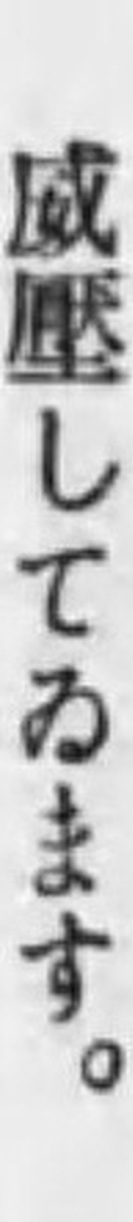威壓してゐます。
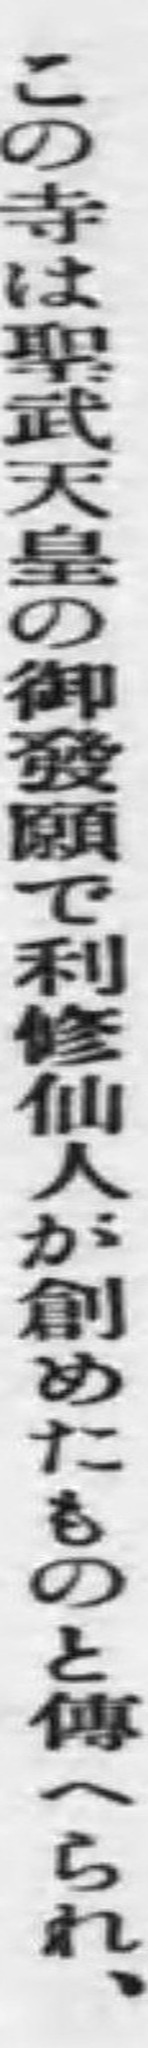この寺は聖武天皇の御發願で利修仙人が創めたものと傳へられ、
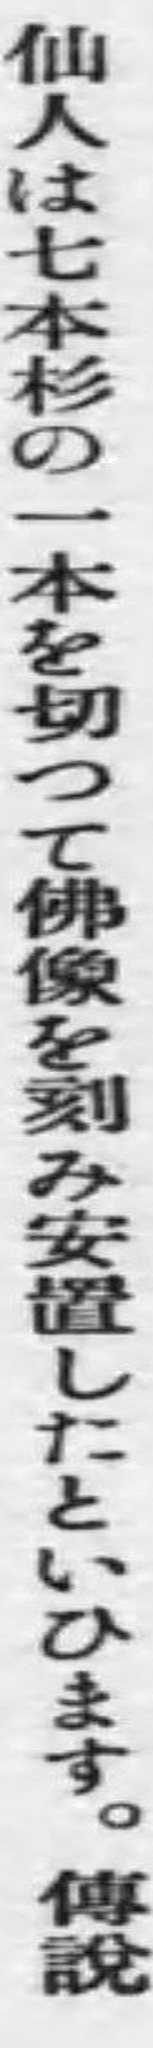仙人は七本杉の一本を切つて佛像を刻み安置したといひます。傳説
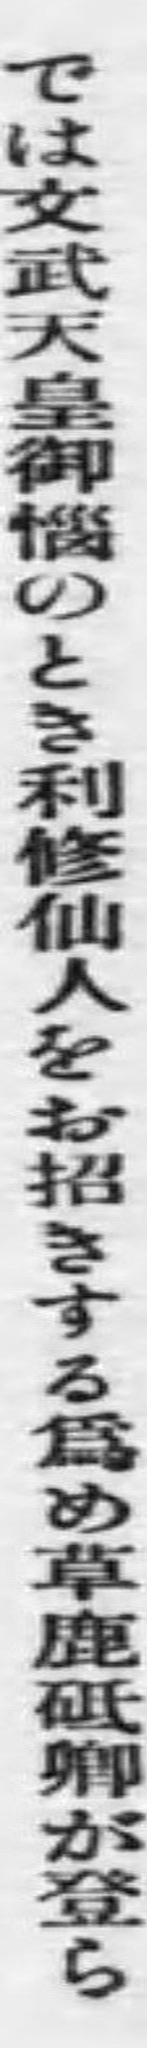では文武天皇御惱のとき利修仙人をお招きする為め草鹿砥卿が登ら
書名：東三河道中記 : 豊橋市及其附近案内
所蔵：国立国会図書館 National Diet Library, JAPAN
